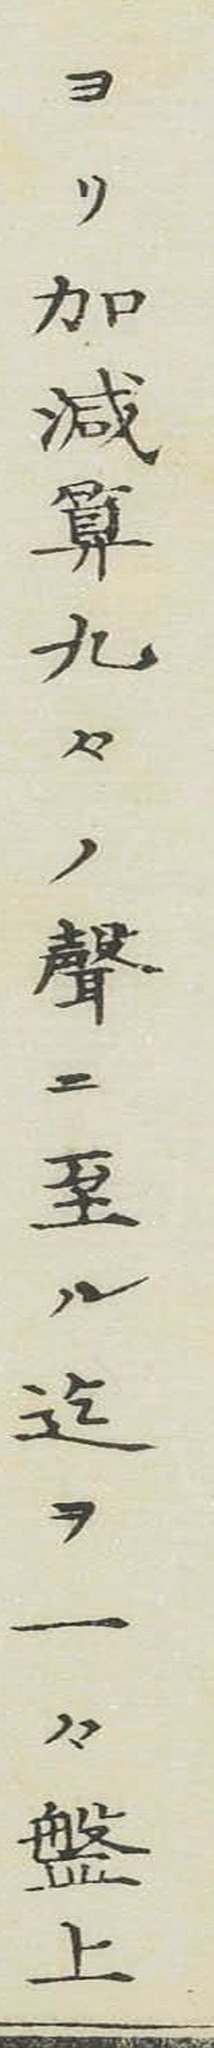ヨリ加減算九々ノ声ニ至ル迄ヲ一々盤上
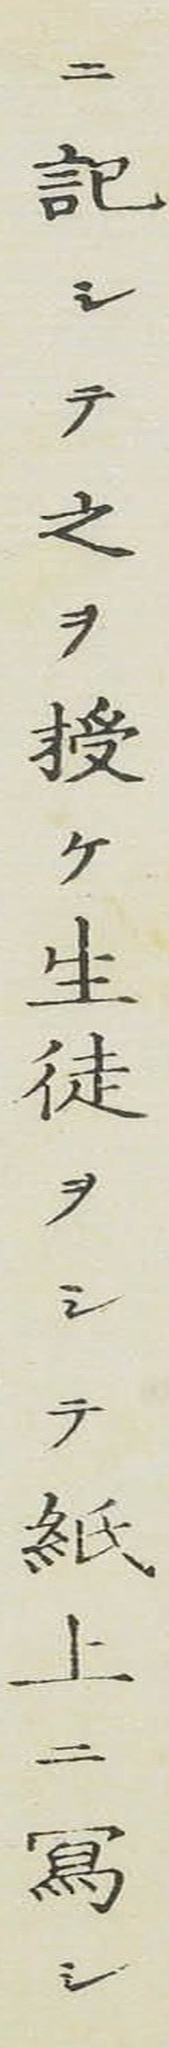ニ記シテ之ヲ授ケ生徒ヲシテ紙上ニ写シ
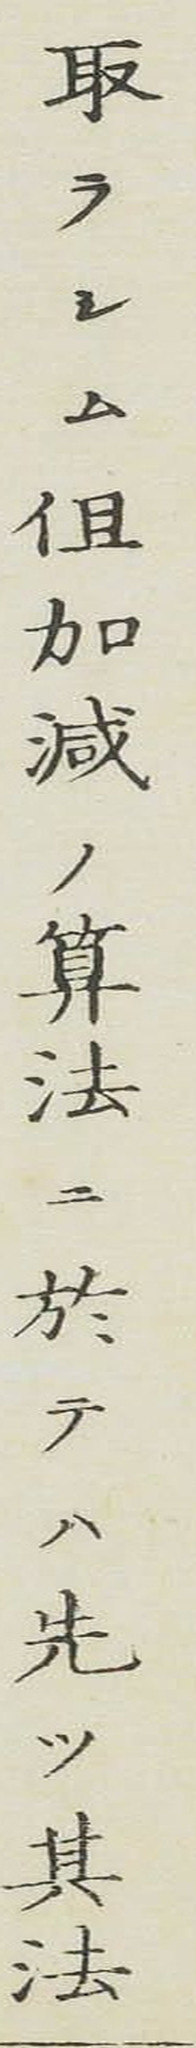取ラシム但加減ノ算法ニ於テハ先ツ其法
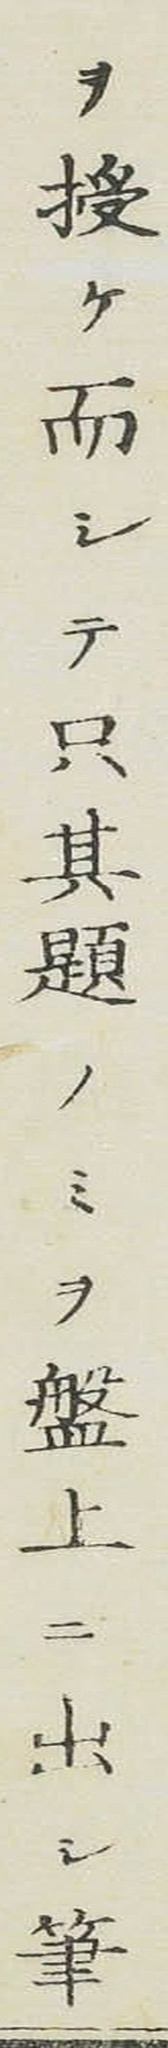ヲ授ケ而シテ只其題ノミヲ盤上ニ出シ筆
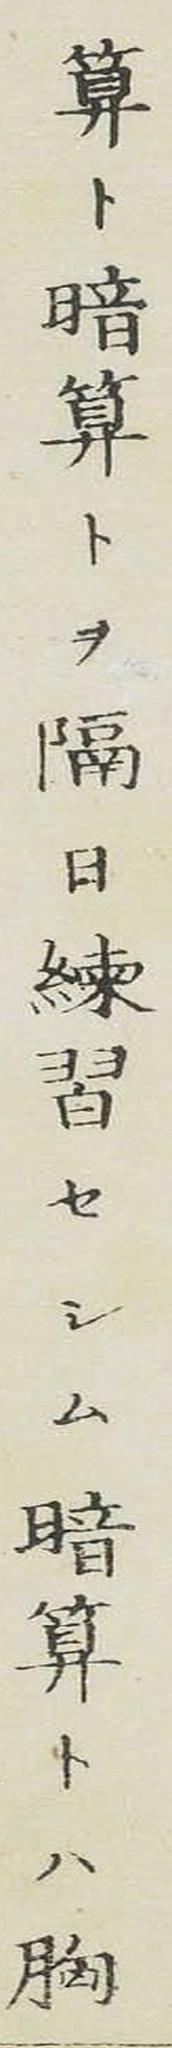算ト暗算トヲ隔日練習セシム暗算トハ胸
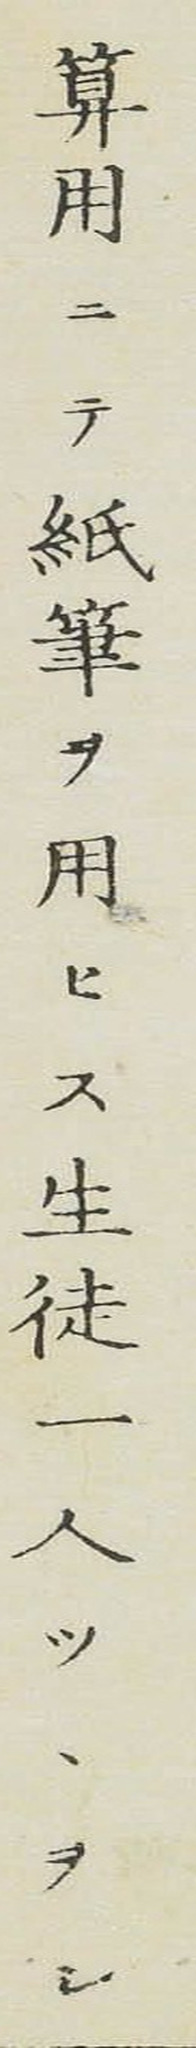算用ニテ紙筆ヲ用ヒス生徒一人ツヽヲシ
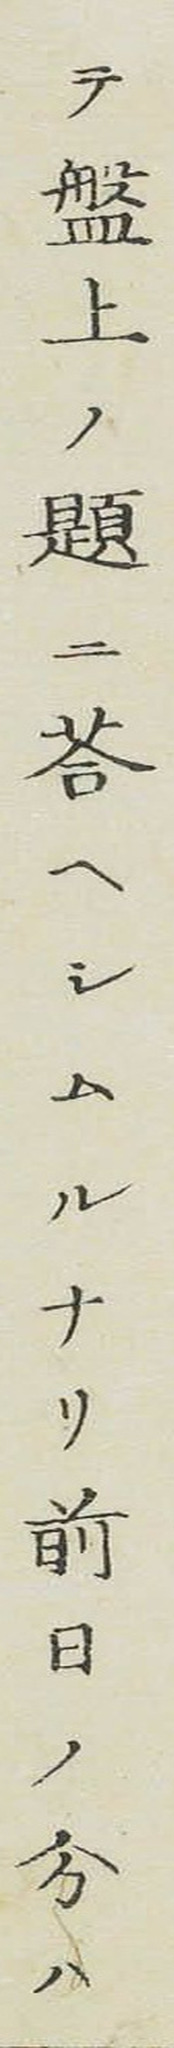テ盤上ノ題ニ答ヘシムルナリ前日ノ分ハ
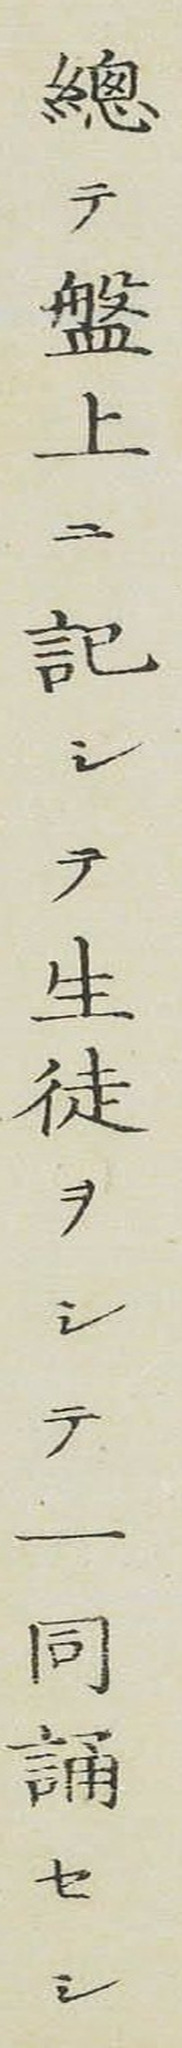総テ盤上ニ記シテ生徒ヲシテ一同誦セシ

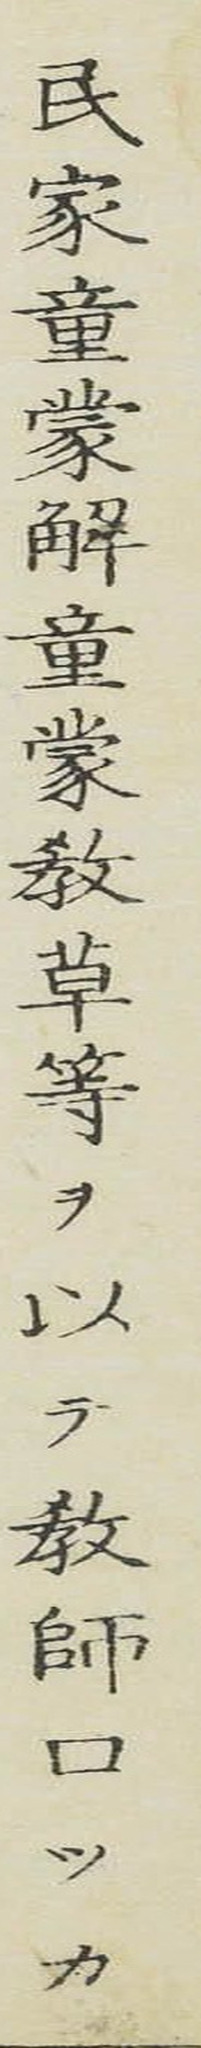民家童蒙解童蒙教草等ヲ以テ教師口ツカ
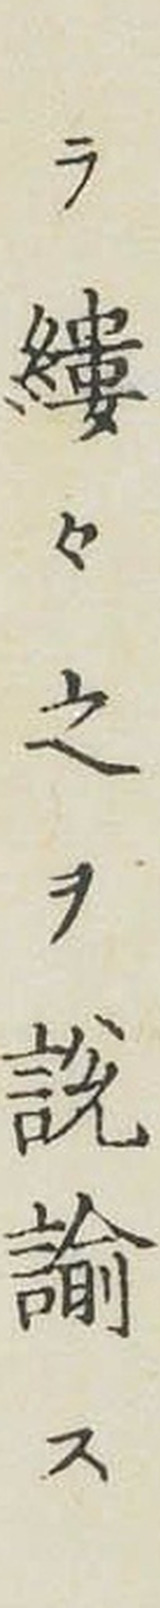ラ縷々之ヲ説諭ス
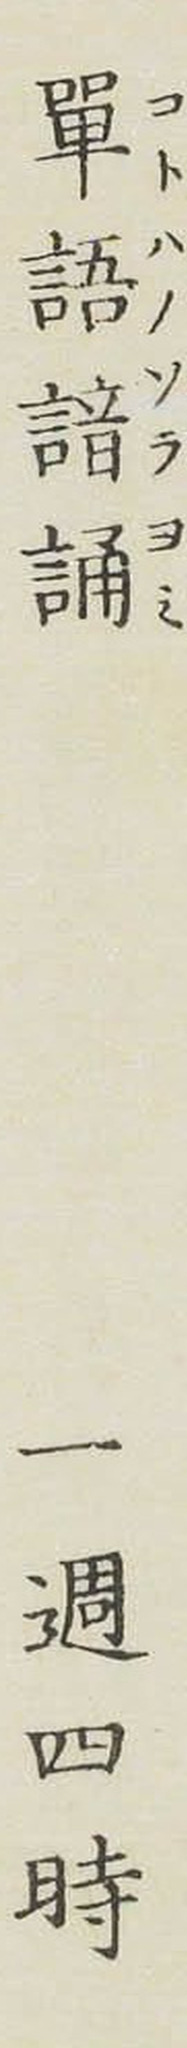単語諳誦一週四時
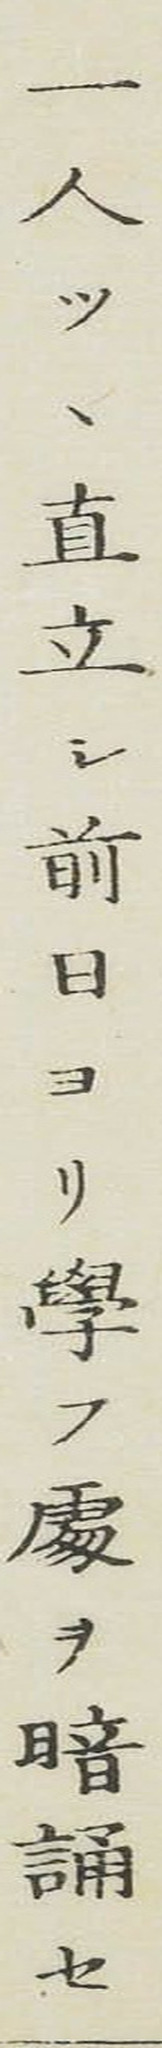一人ツヽ直立シ前日ヨリ学フ處ヲ暗誦セ
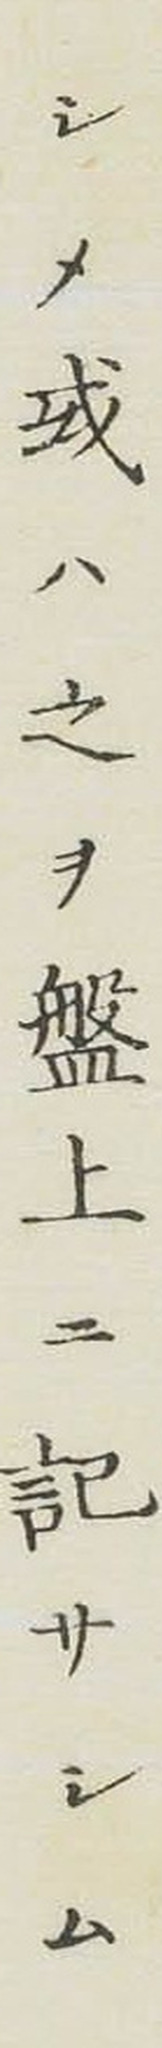シメ或ハ之ヲ盤上ニ記サシム
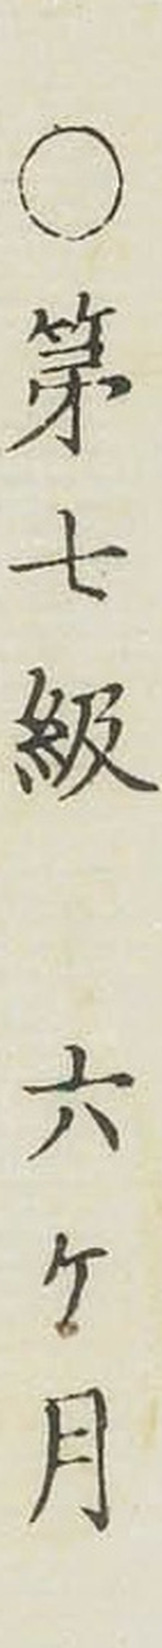○第七級六ケ月
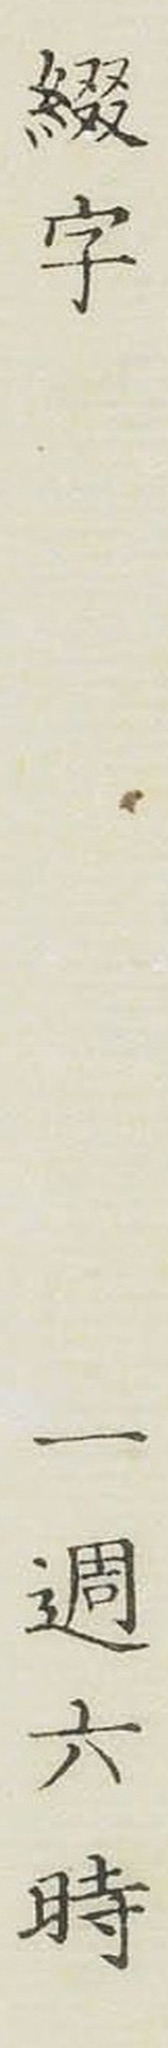綴字一週六時
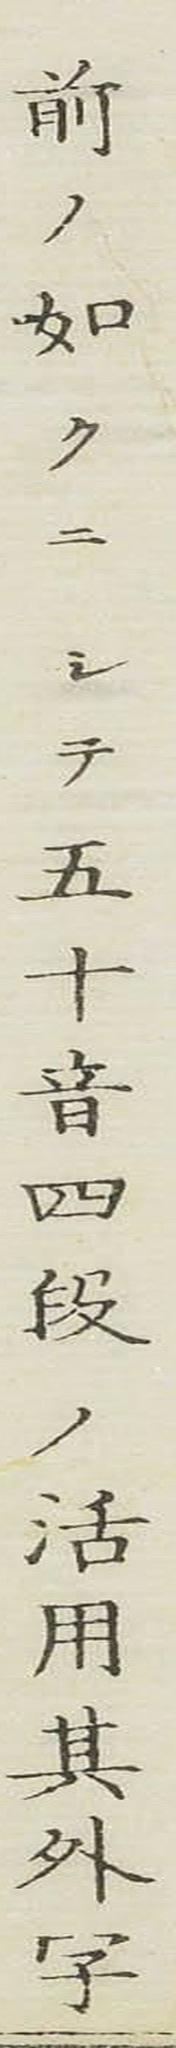前ノ如クニシテ五十音四段ノ活用其外字
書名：小学教則
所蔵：東京学芸大学教育コンテンツアーカイブ
